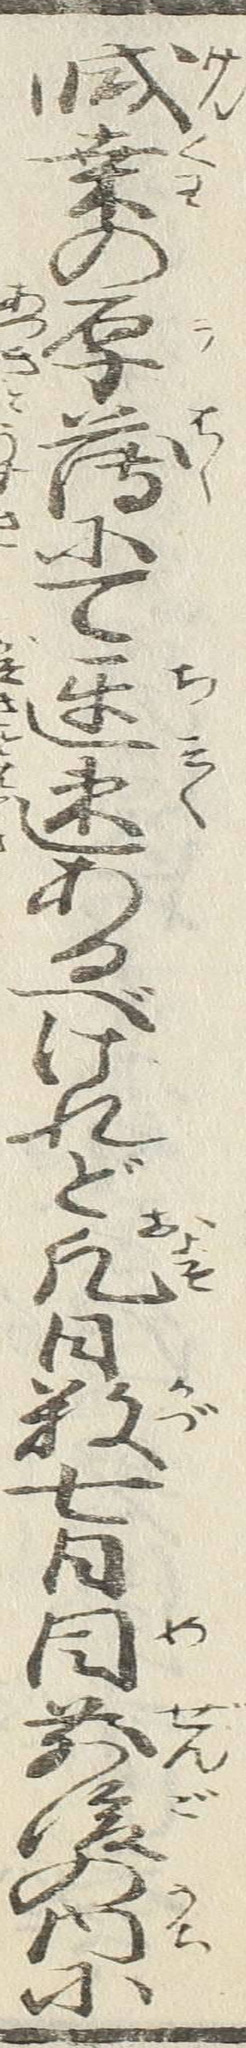減桑の厚薄にて遅速あるべけれど凡日数七日目前後の内に
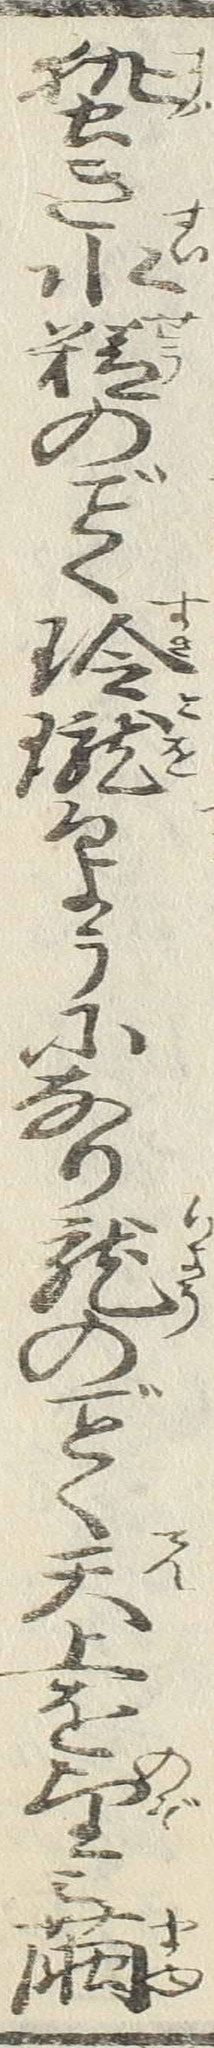蟄き水精のごとく玲瓏るようになり龍のごとく天上を望み繭
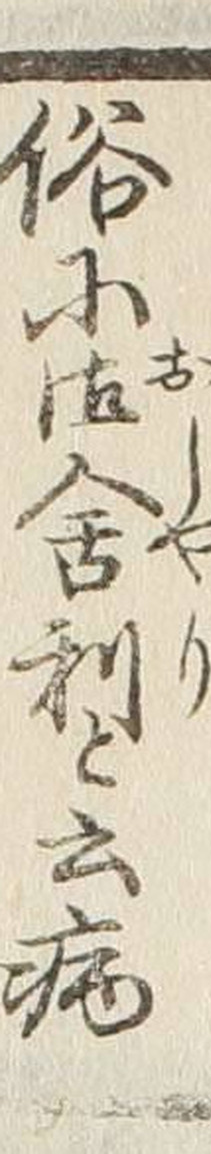俗に御舎利と云病
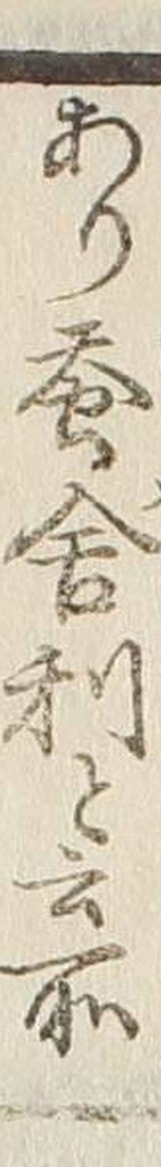あり蚕舎利と云う所
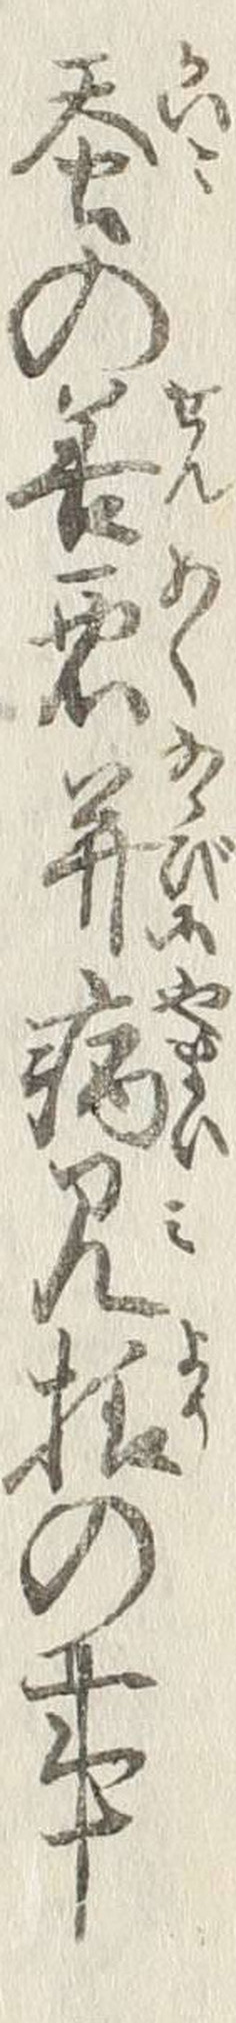蚕の善悪幷病見様の事
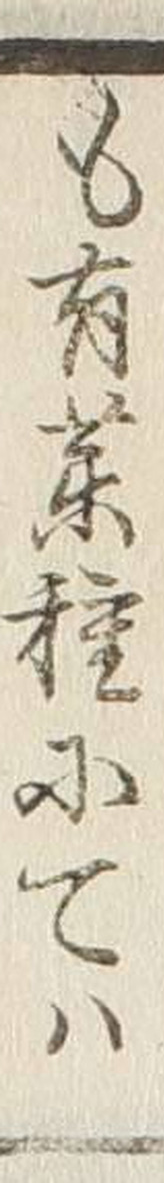も有薬種にては
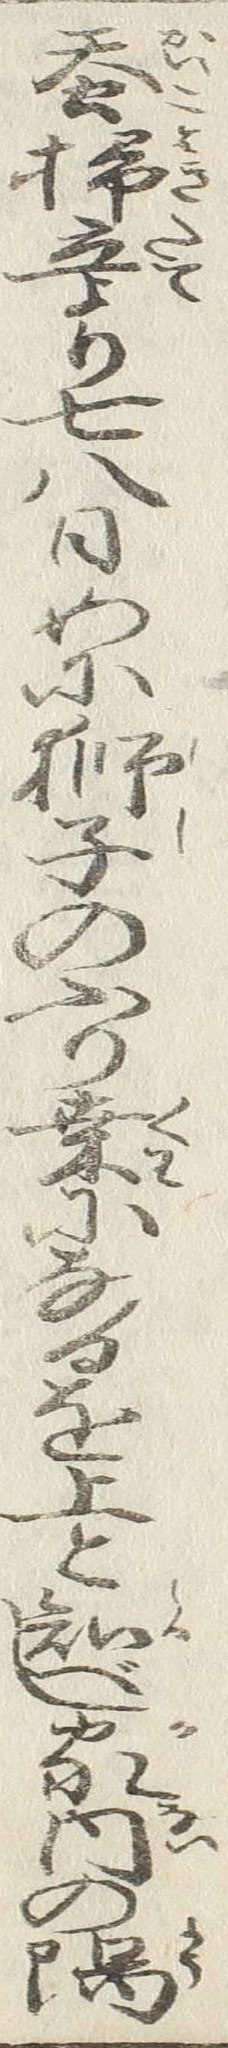蚕掃立より七八日めに獅子のふり桑になるを上と知べし家内の陽
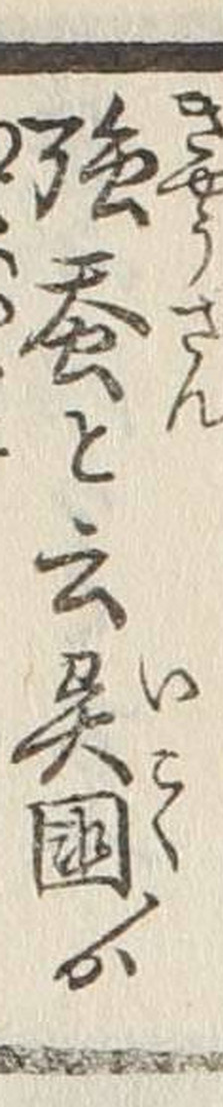強蚕と云異国ゟ
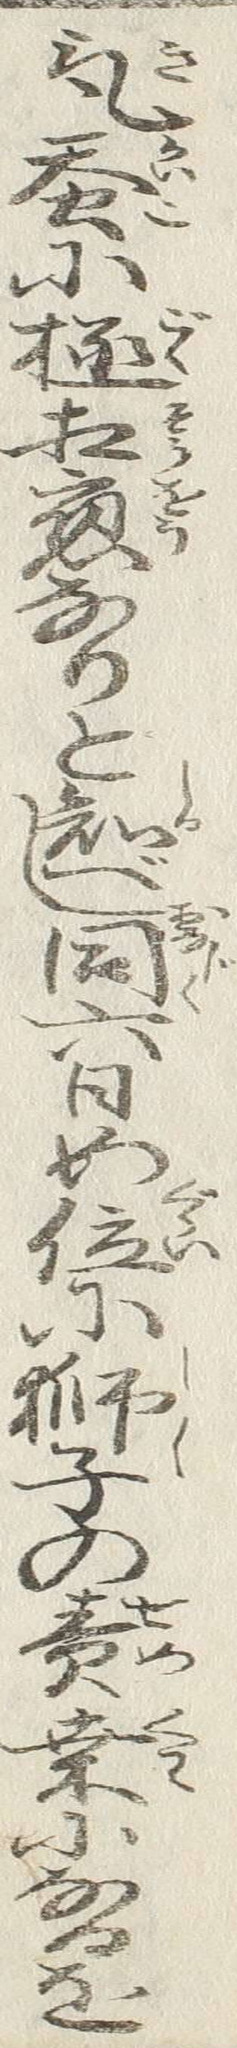気蚕に極相應なりと知べし同六日め位に獅子の責桑になるを
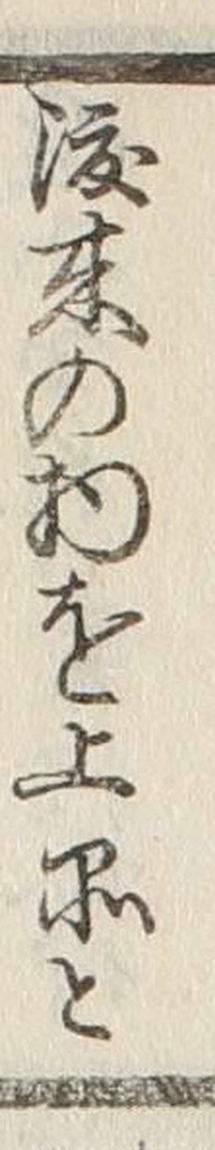渡来の物を上品と
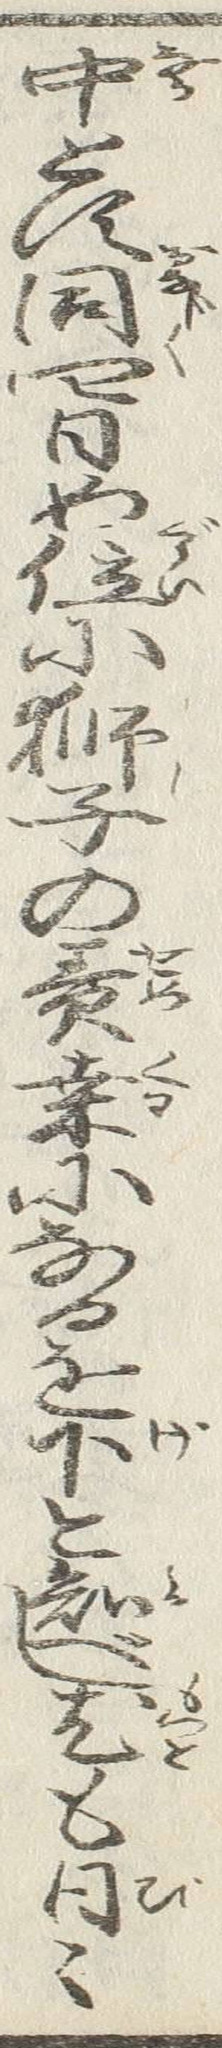中とす同四日め位に獅子の責桑になるを下と知べし尤も日々
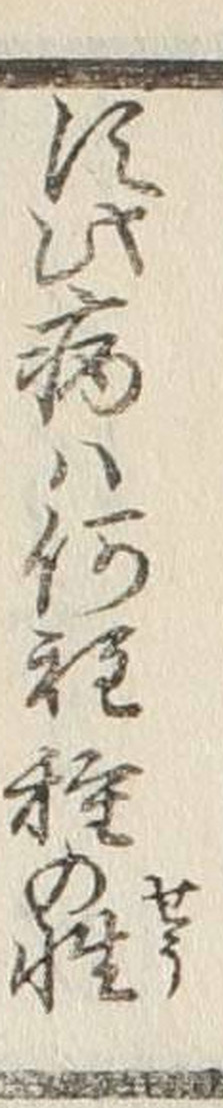す此病は何程種の性
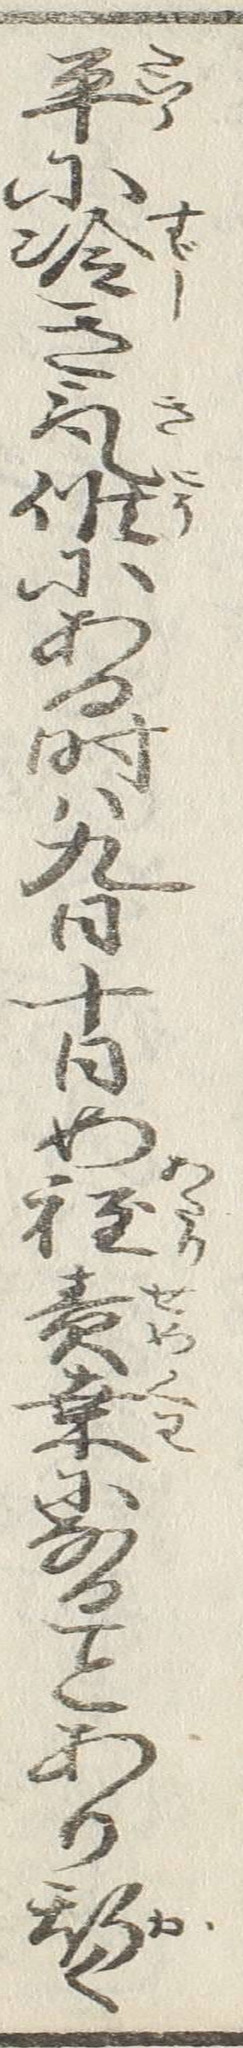平に冷き気候にある時は九月十日め程責桑になることあり斯く
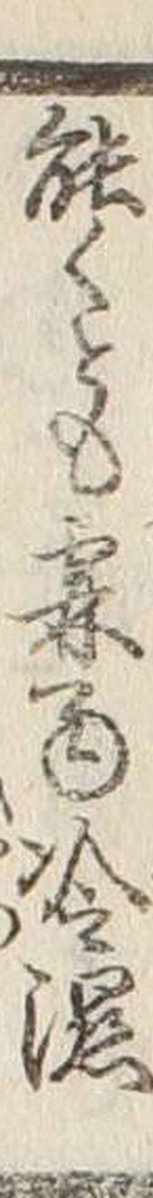能くとも霖雨冷湿
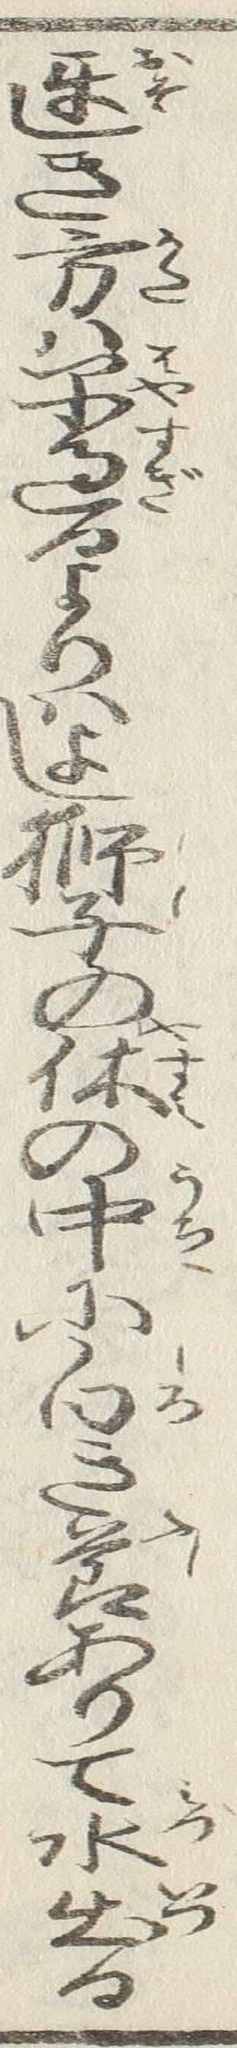遅き方は早過るよりはよし獅子の休の中に白き節ありて水出る
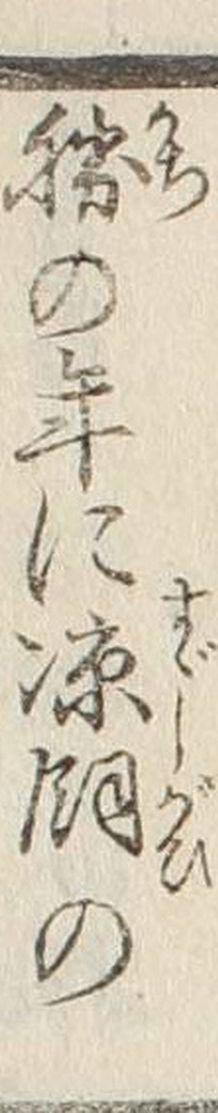勝の年に涼飼の
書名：養蠶實驗録
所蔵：東京大学農学生命科学図書館 国文学研究資料館
